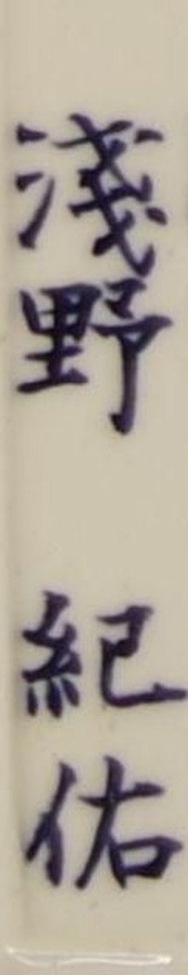浅野紀佑

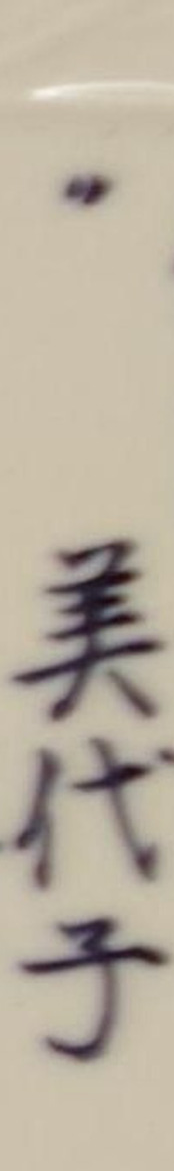美代子
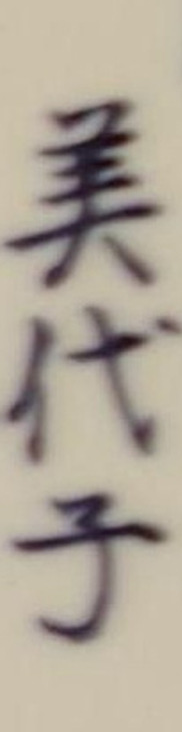美代子
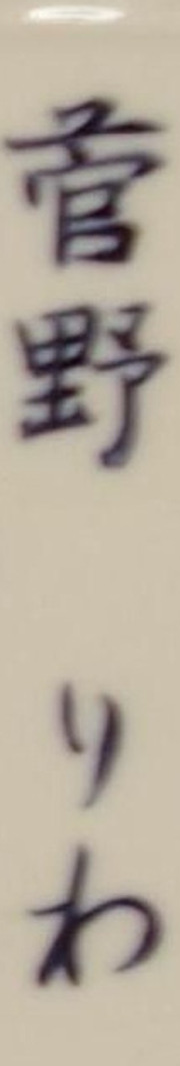菅野りわ
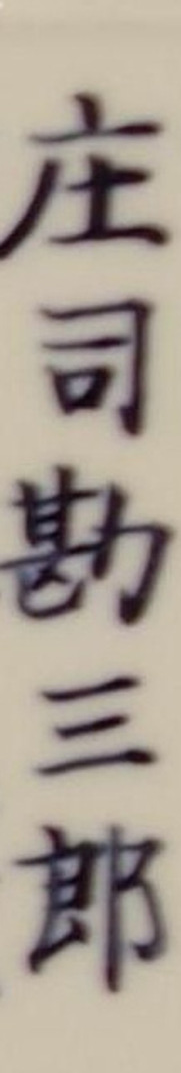庄司勘三郎
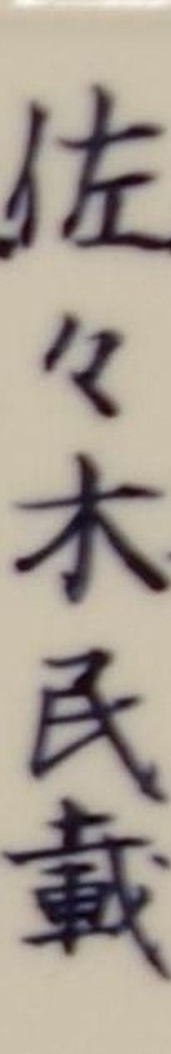佐々木民載
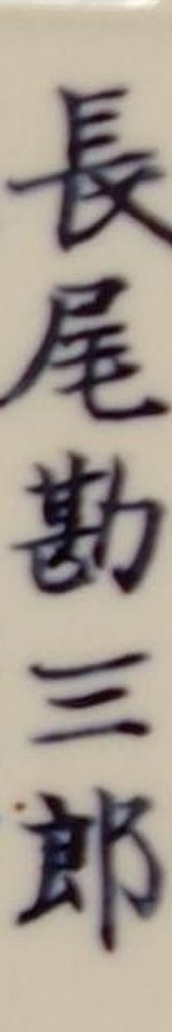長尾勘三郎
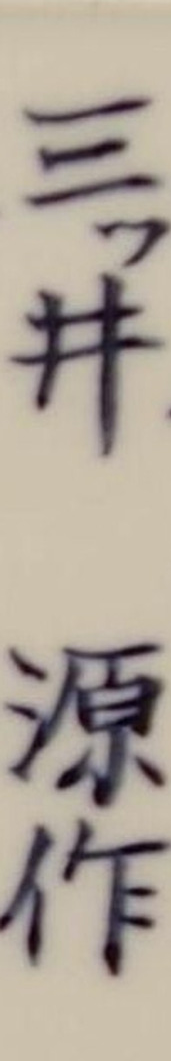三ッ井源作
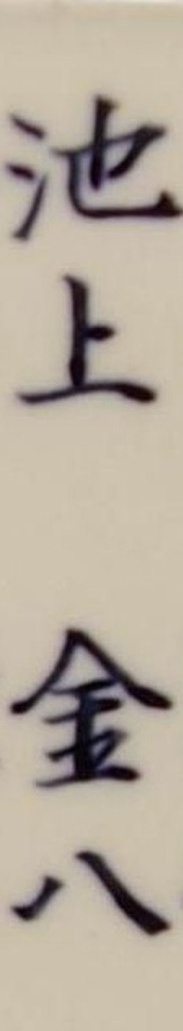池上金八
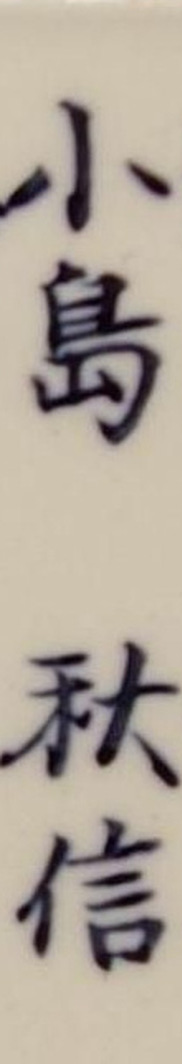小島秋信
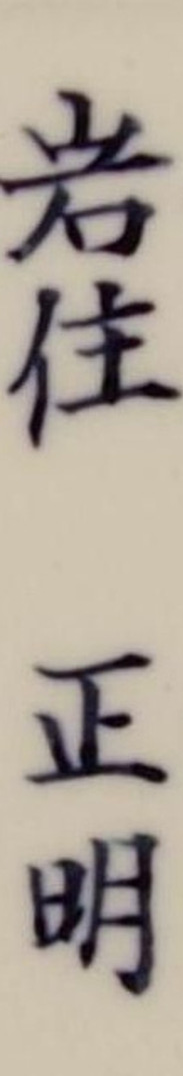岩住正明
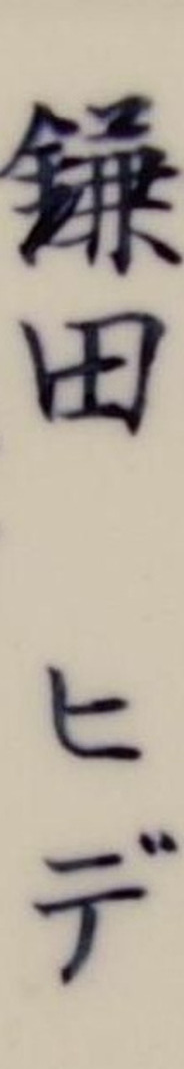鎌田ヒデ
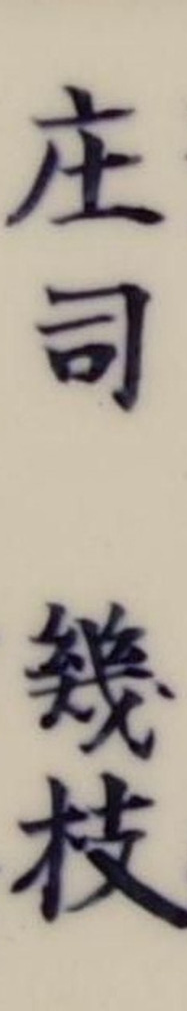庄司幾枝
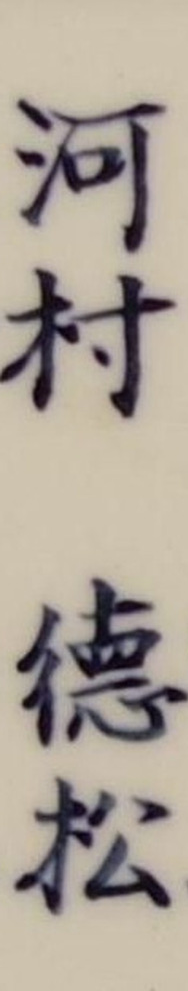河村徳松
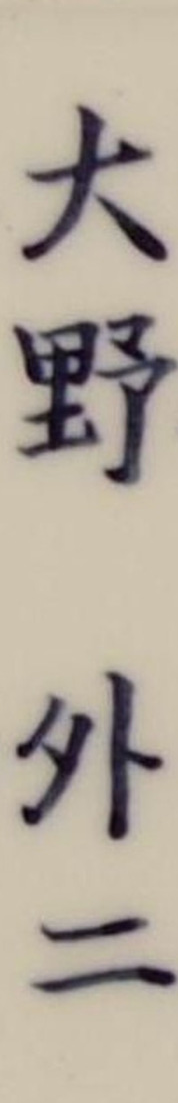大野外二
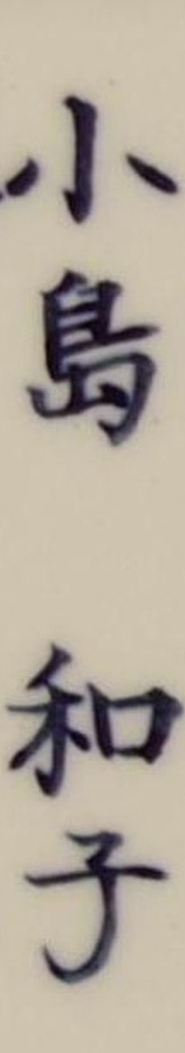小島和子
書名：M~S
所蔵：高野山金剛峯寺
